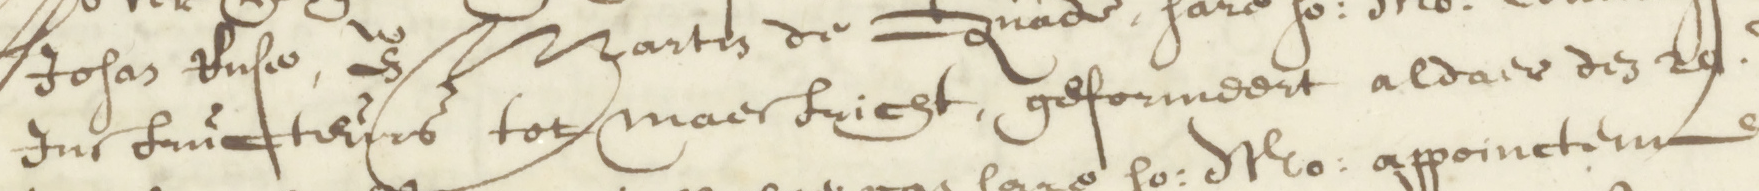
Instructeurs tot maestricht, geformeert aldaer den 29en.
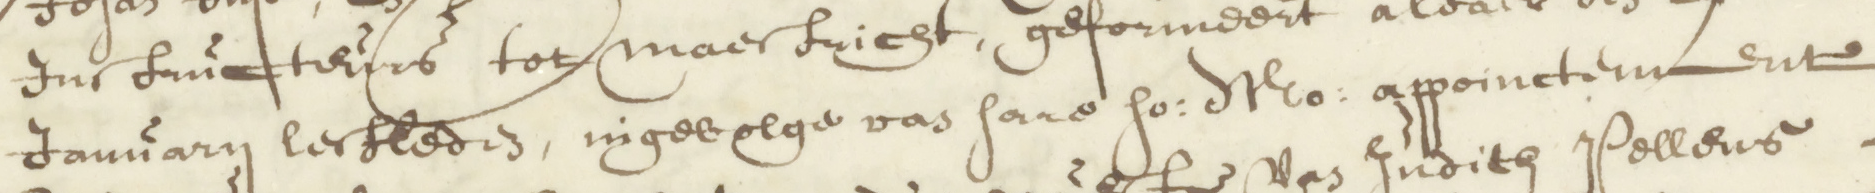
January lestleden, ingevolge van hare ho:Mo: appoinctement
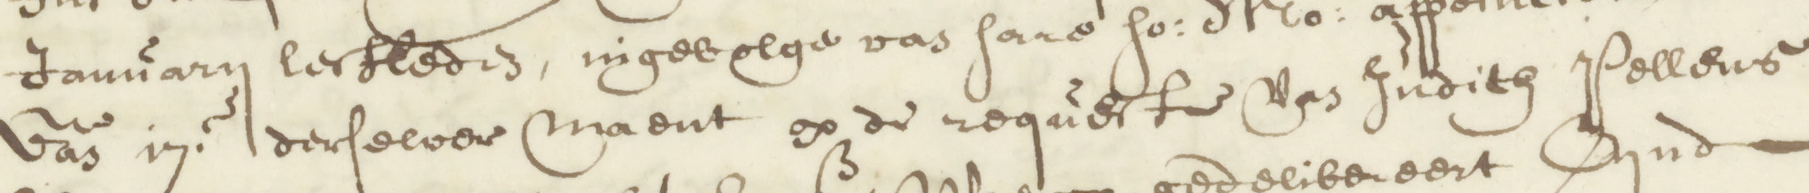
van 17en. derselver maent op de requeste Van Judith Pellens
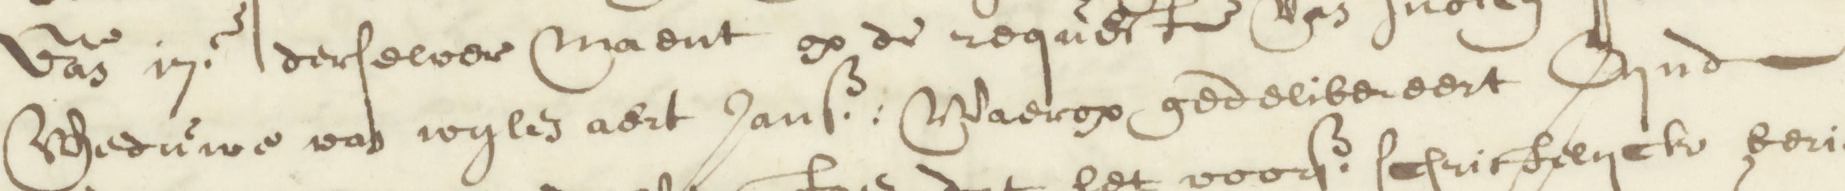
Weduwe van wylen aert Jans.: Waerop gedelibereert Zynde
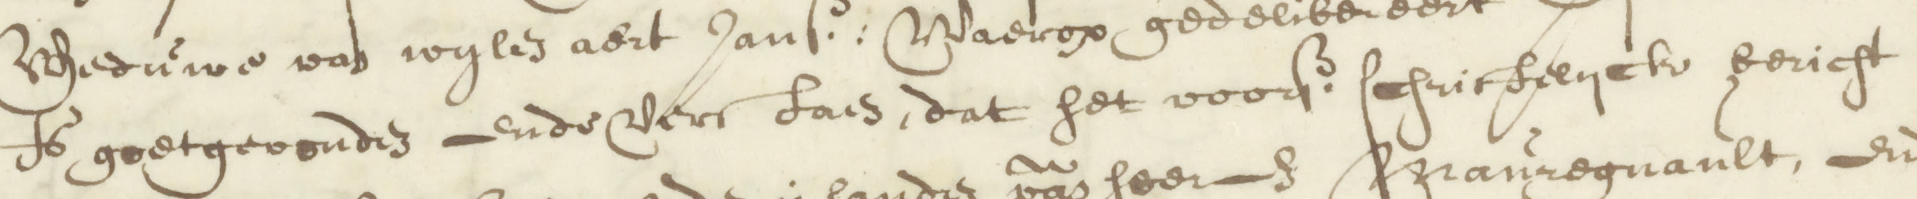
Is goetgevonden ende Verstaen, dat het voors. schriftelyck bericht
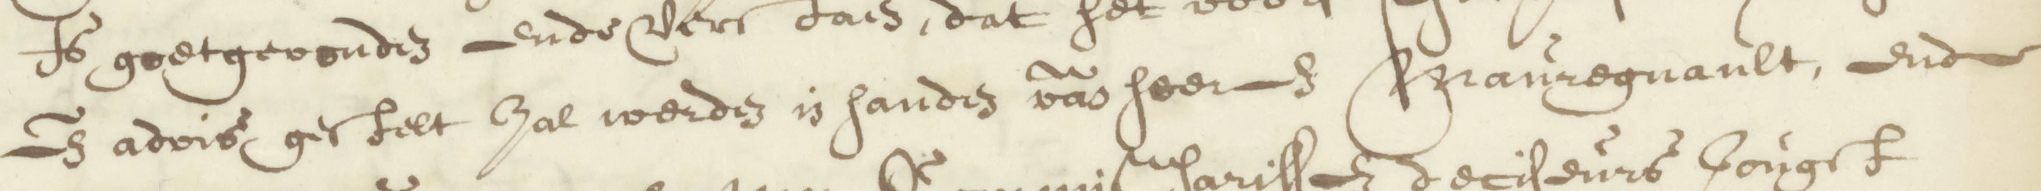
en advis gestelt zal werden in handen van heeren Mauregnault, ende
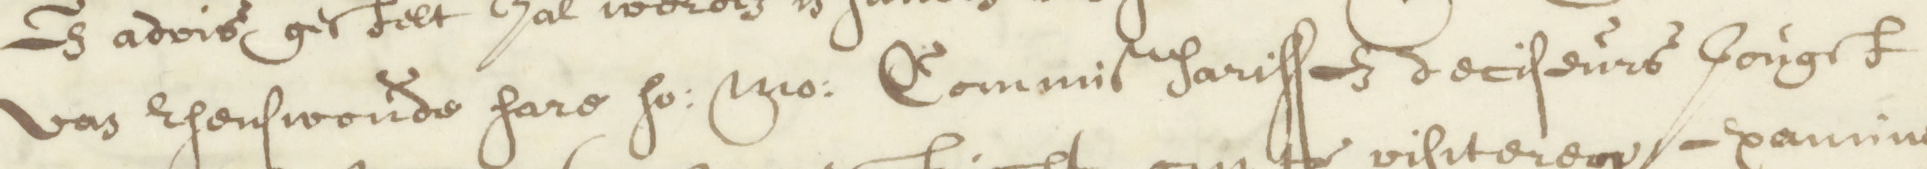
van rhenswoude hare ho:Mo: Commissarissen deciseurs Jongst
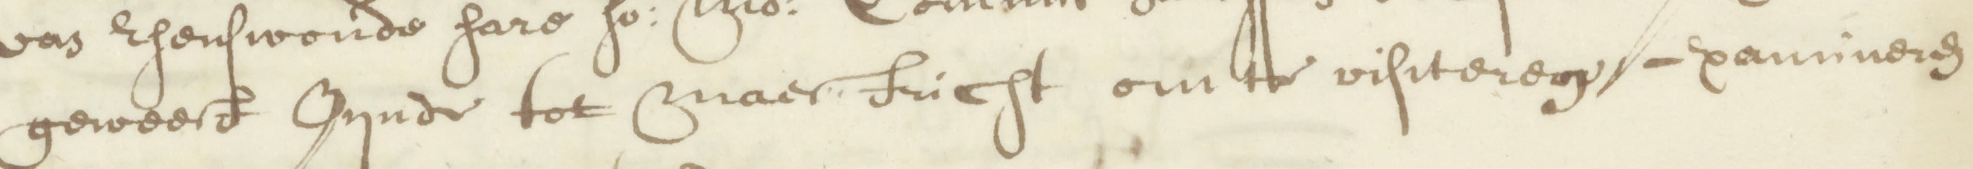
geweest Zynde tot maestricht om te visiteren, examineren
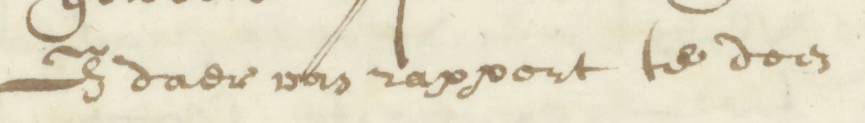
en daer van rapport te doen
